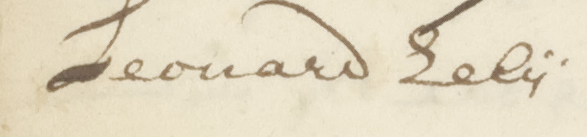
Leonard Zelij
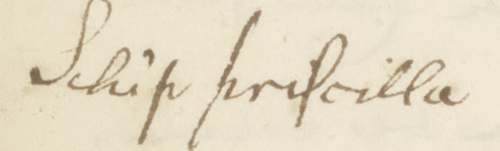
Schip Priscilla
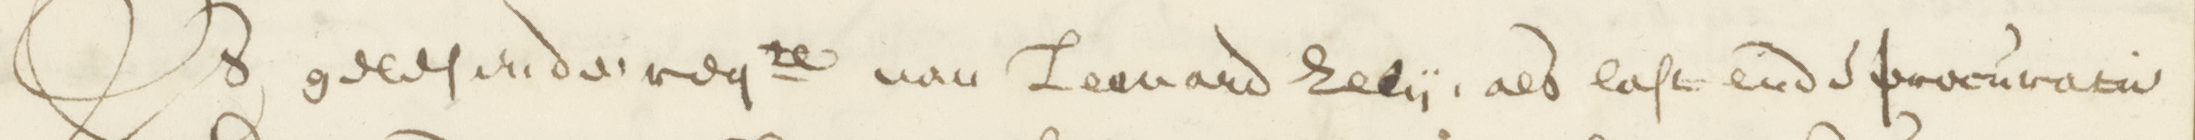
Is gelesen de reqte van Leonard Zelij, als last ende procuratie
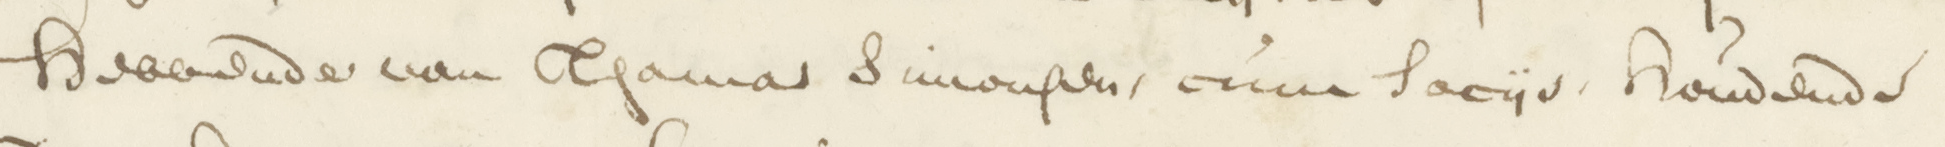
hebbende van Thomas Simonsen, cum socijs, houdende
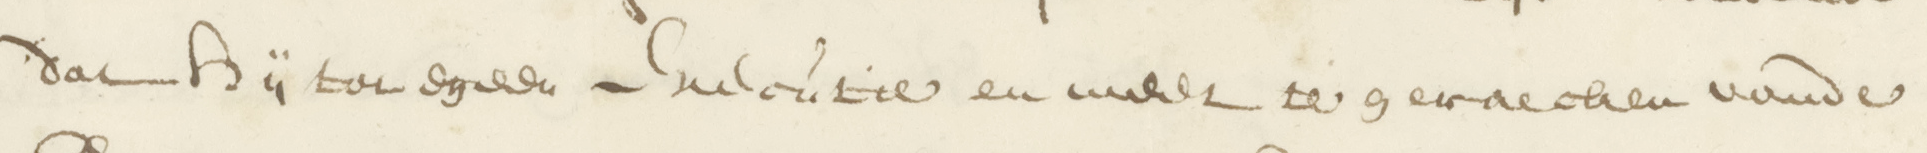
dat hij tot egeen Executie en weet te geraecken vande
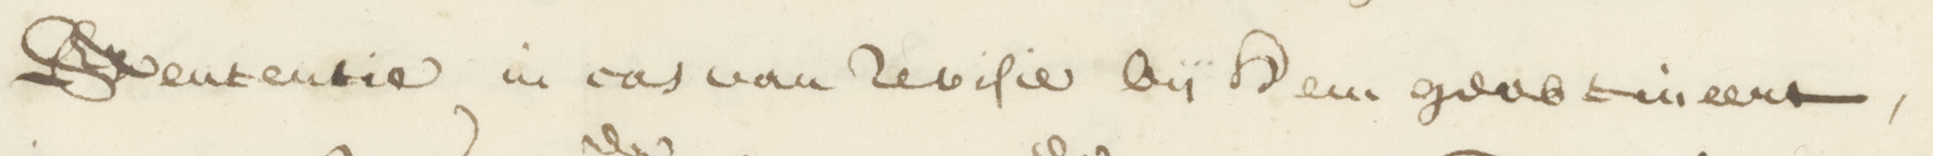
Sententie in cas van revisie bij hem geobtineert
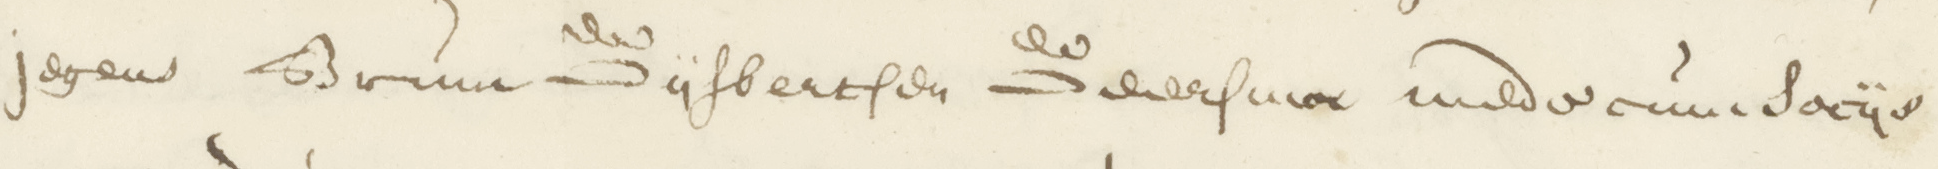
jegens Brun Gijsbertsen Geersma mede cum socijs
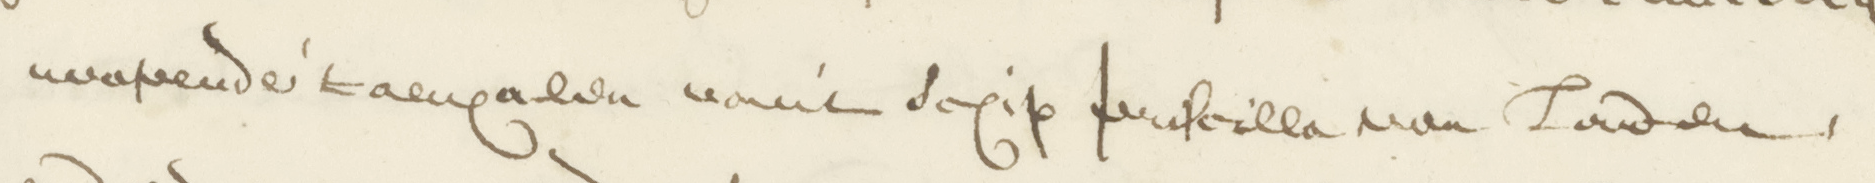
noopende 't aenhalen van 't schip Priscilla van Londen,
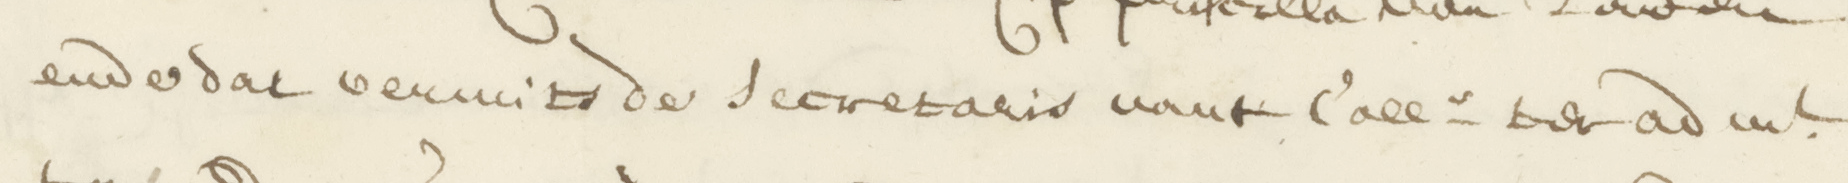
ende dat vermits de secretaris vant Colle ter Admt
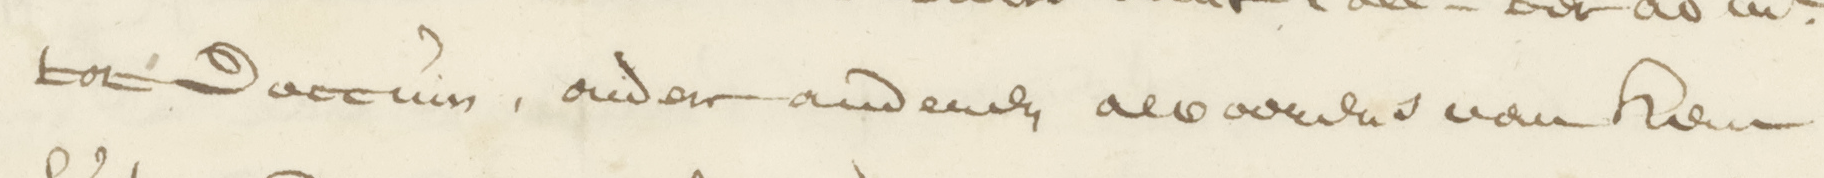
tot Doccum, onder anderen alvoorens van hem
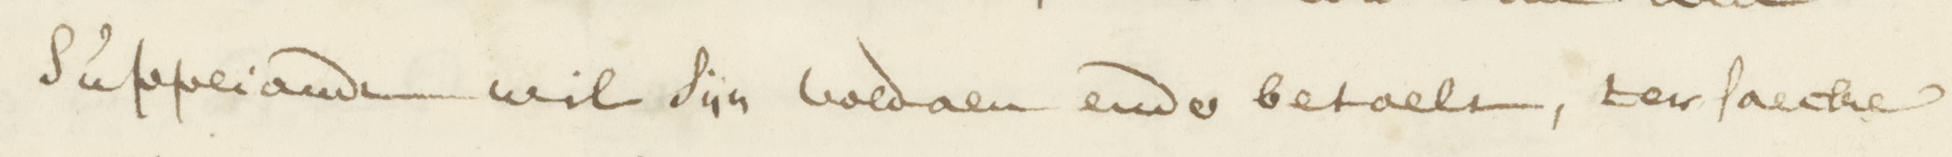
suppliandt wil sijn voldaen ende betaelt, ter saecke
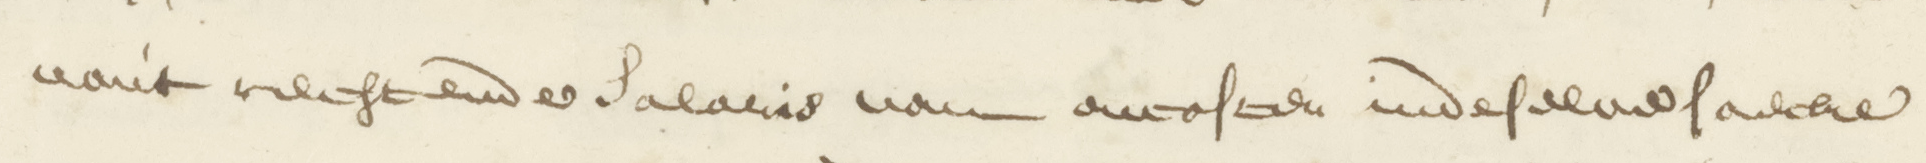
van't recht ende salaris van oncosten in deselve saecke
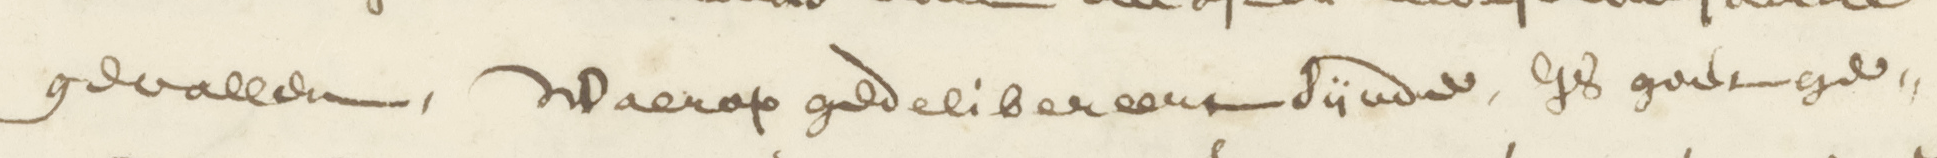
gevallen. Waerop gedelibereert sijnde, Is goet ge„
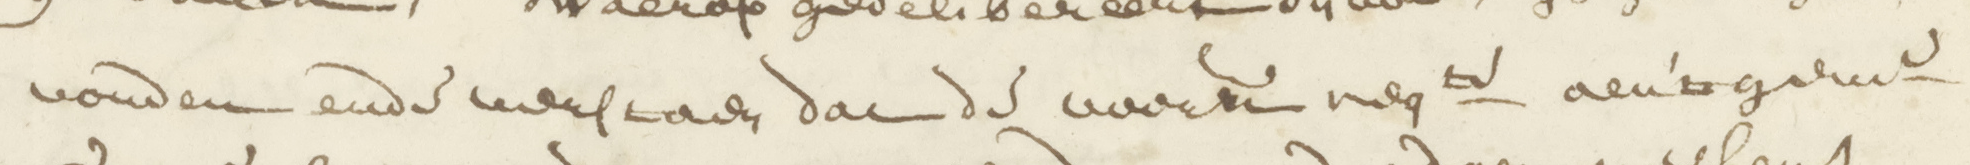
vonden ende verstaen dat de voern reqte aen't gene
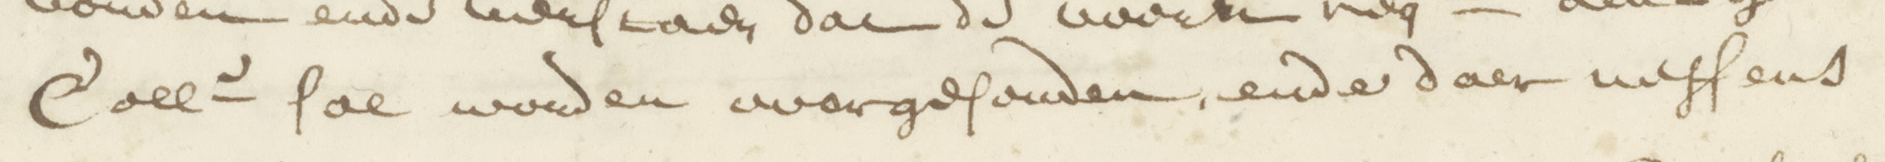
Colle sal worden overgesonden, ende daer neffens
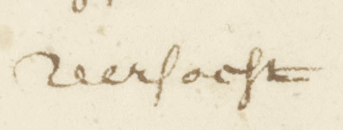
versocht
